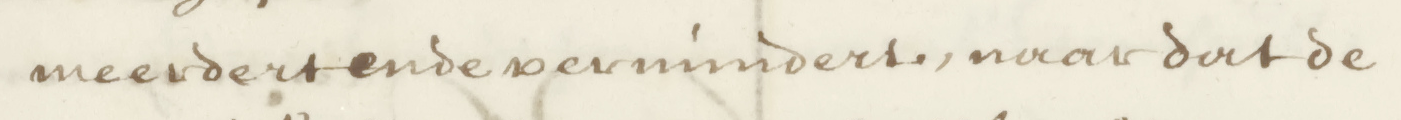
meerdert ende vermindert, naar dat de
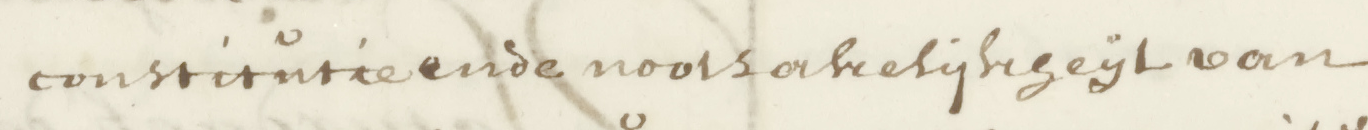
constitutie ende nootsakelijkheijt van
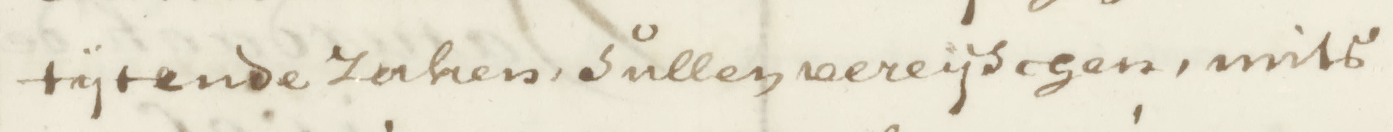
tijt ende zaken, sullen vereijschen, mits
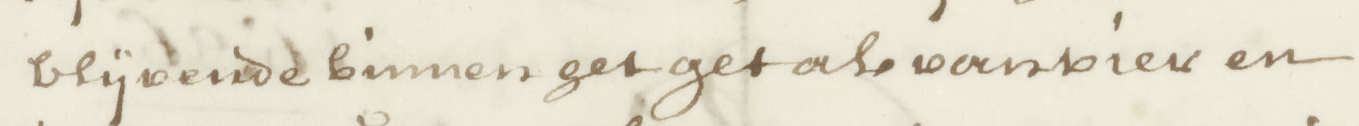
blijvende binnen het getal van vier en
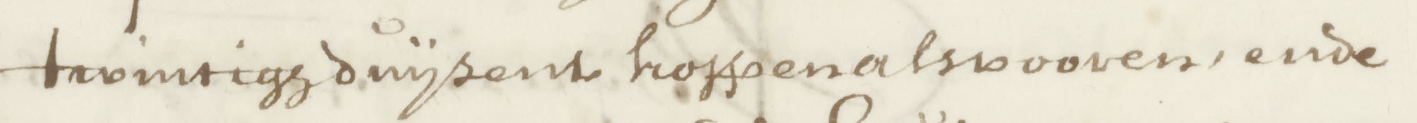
twintigh duijsent koppen als vooren, ende
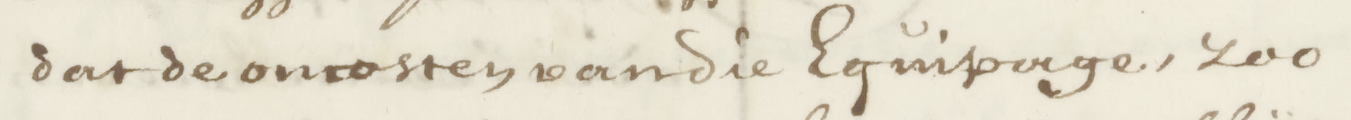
dat de oncosten vandie Equipage, zoo
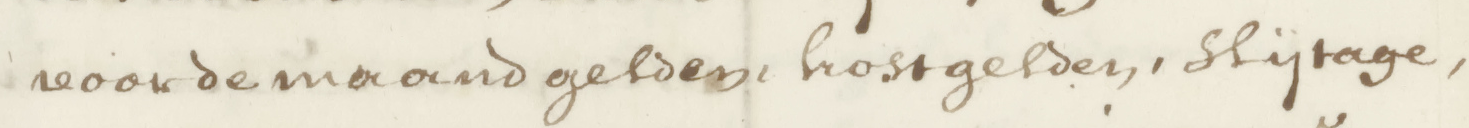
voor de maandgelden, kostgelden, slijtage,
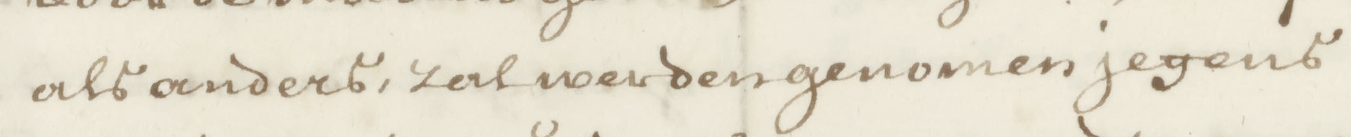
als anders, zal werden genomen jegens
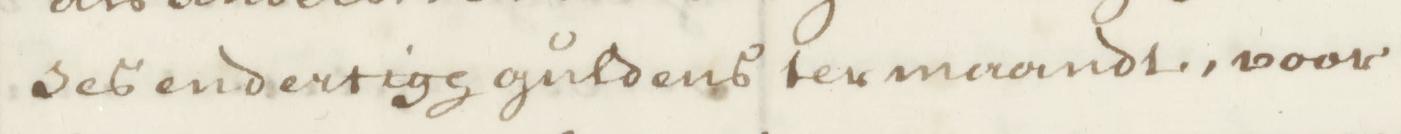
ses endertigh guldens ter maandt, voor
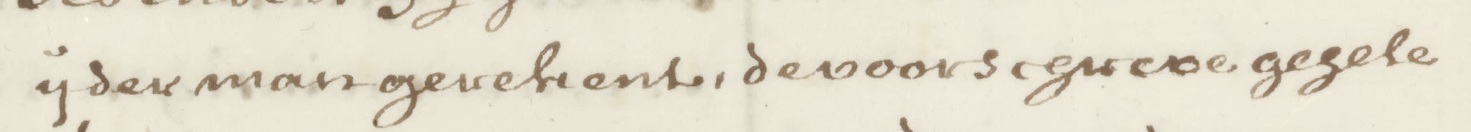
ijder man gerekent, de voorschreve gehele
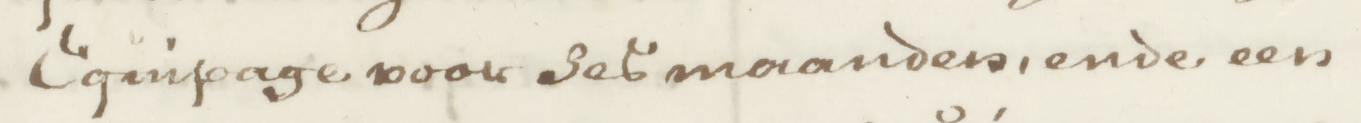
Equipage voor ses maanden, ende een
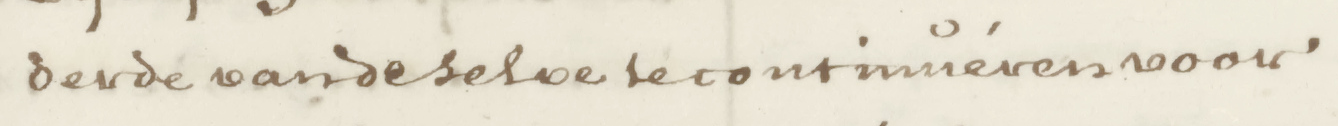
derde van deselve te continueren voor
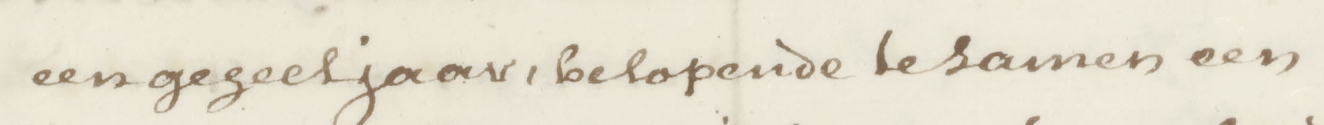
een geheel jaar, belopende tesamen een
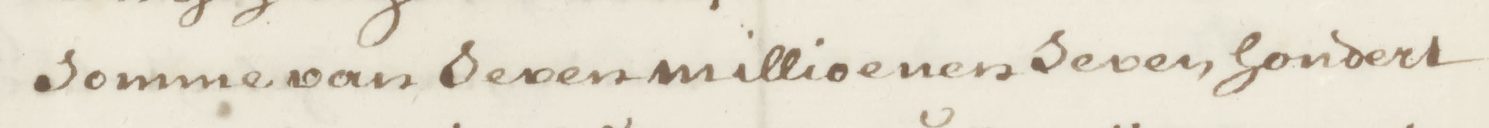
somme van seven millioenen seven hondert
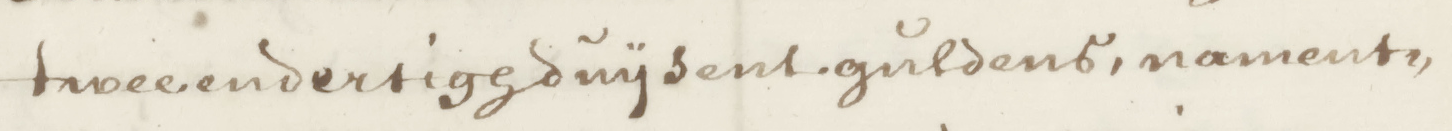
tweeendertighduijsent guldens, nament„
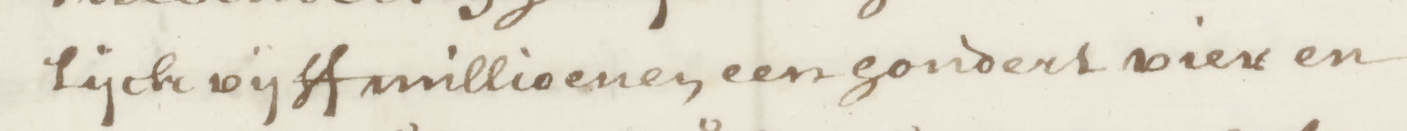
lijck vijffmillioenen een hondert vier en
